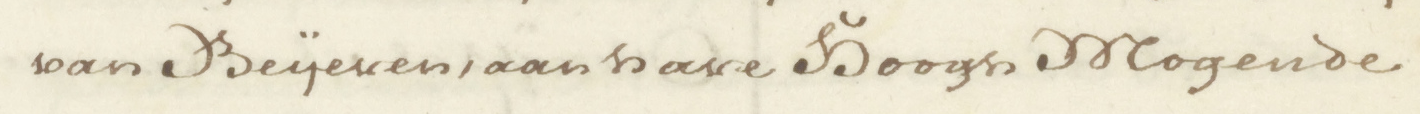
van Beijeren, aan hare Hoogh Mogende
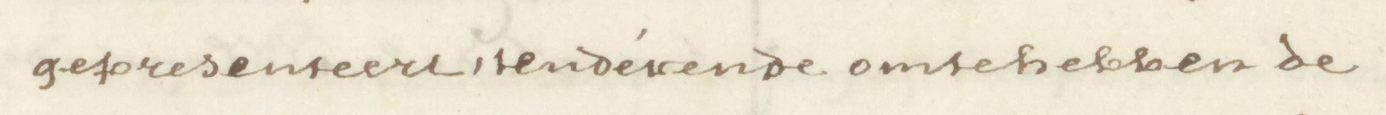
gepresenteert, tenderende om te hebben de
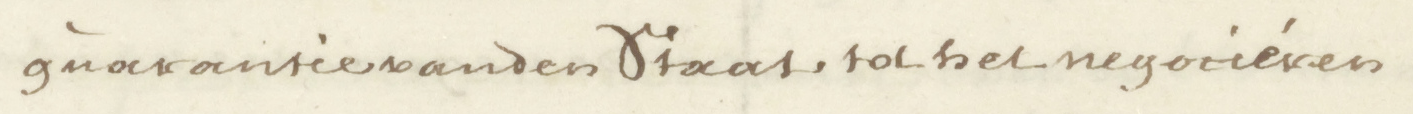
guarantie vanden Staat, tot het negocieren
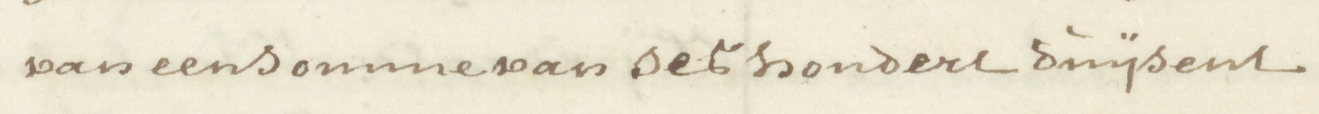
van een somme van ses hondert duijsent
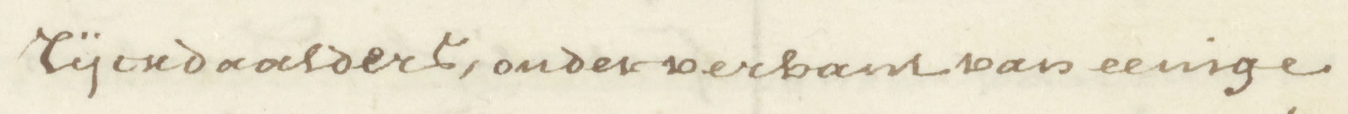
Rijcxdaalders, onder verbant van eenige
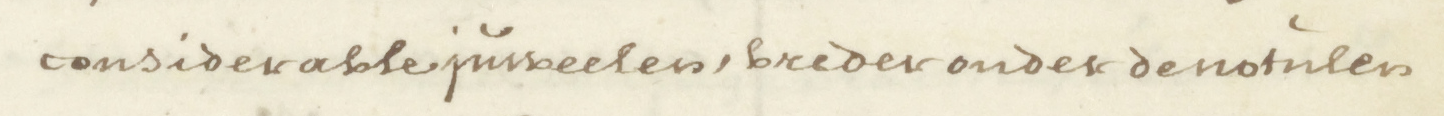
considerable juweelen, breder onder de notulen
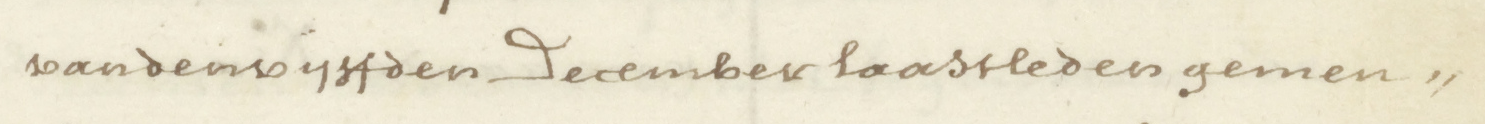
vanden vijffden December laastleden gemen„
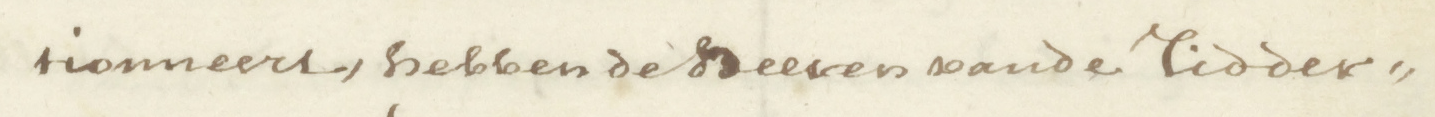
tionneert, hebben de heeren vande Ridder„
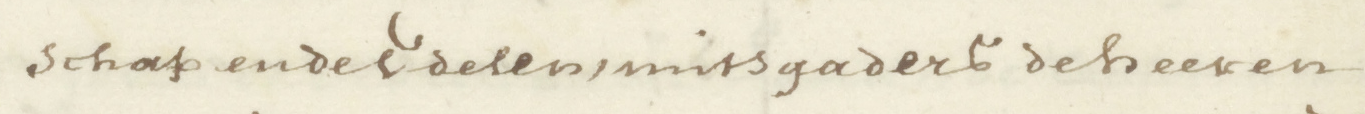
schap ende Edelen, mitsgaders de heeren
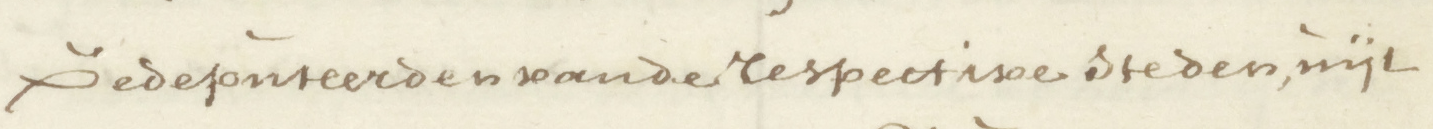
Gedeputeerden vande respective steden uijt
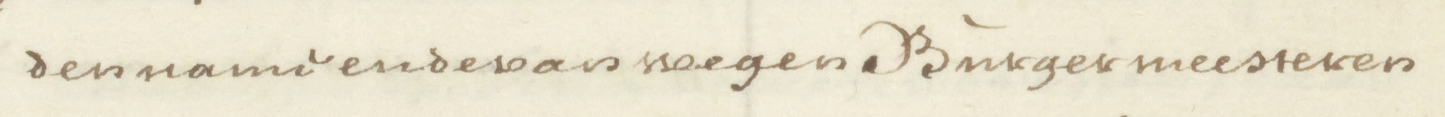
den name ende van wegen Burgermeesteren
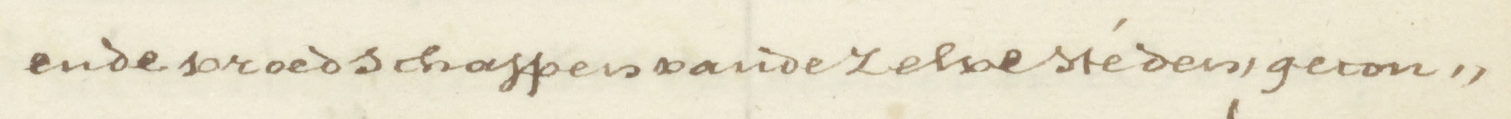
ende vroedschappen vande zelve steden, gecon„
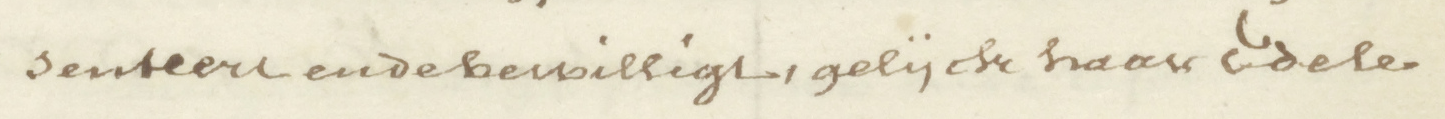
senteert ende bewilligt, gelijck haar Edele
